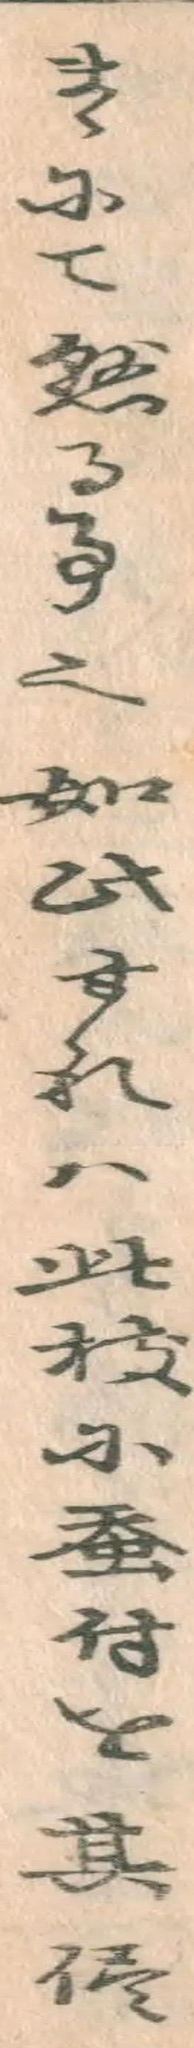まゝにて懸る事也如此すれは此枝に蚕付を其侭
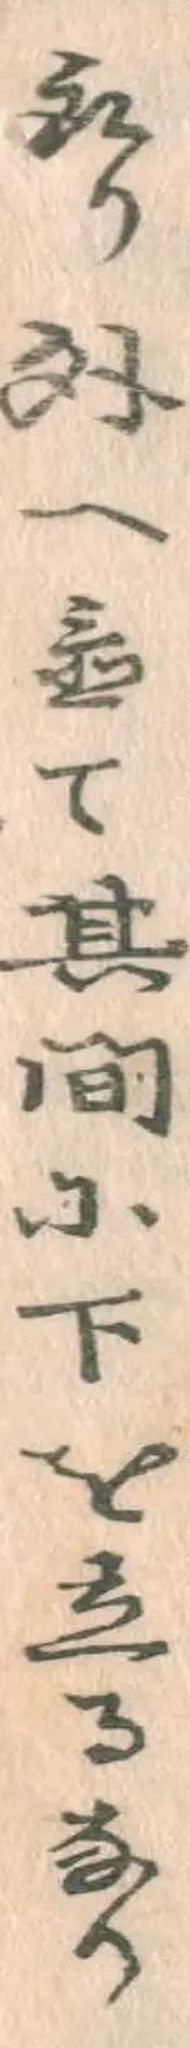取り外へ置て其間に下を立るなり
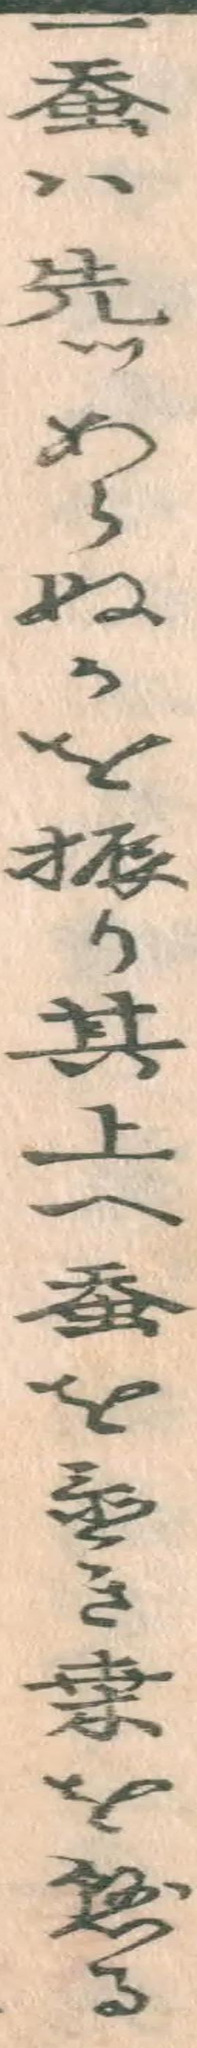一蚕は先つあらぬかを振り其上へ蚕を置き桑を懸る
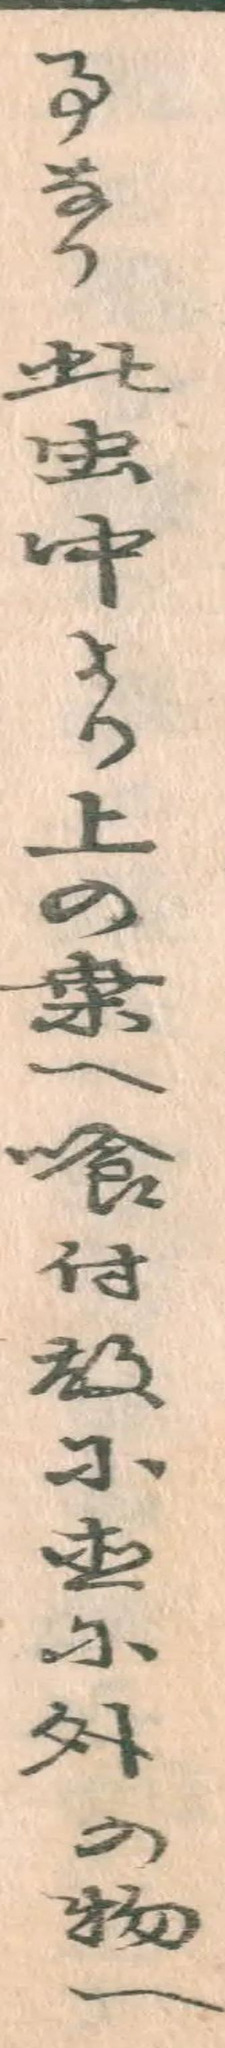事なり此虫中より上の桑へ喰付故に直に外の物へ
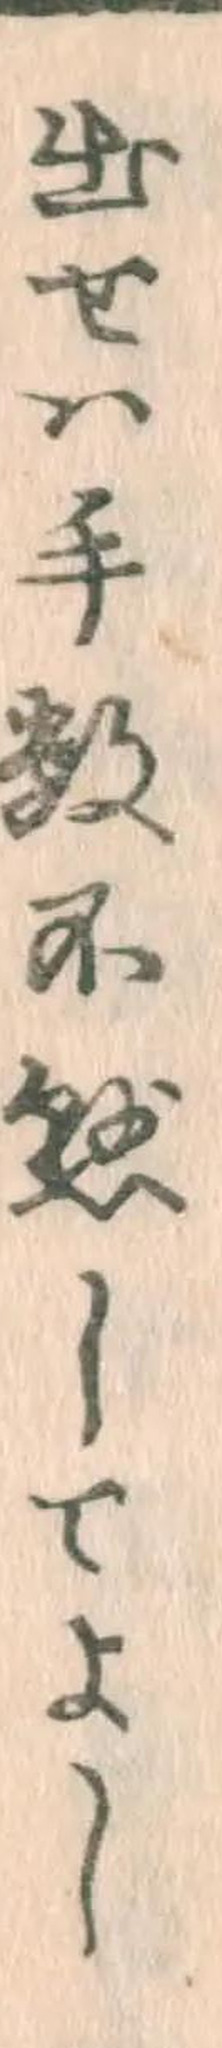出せは手数不懸してよし
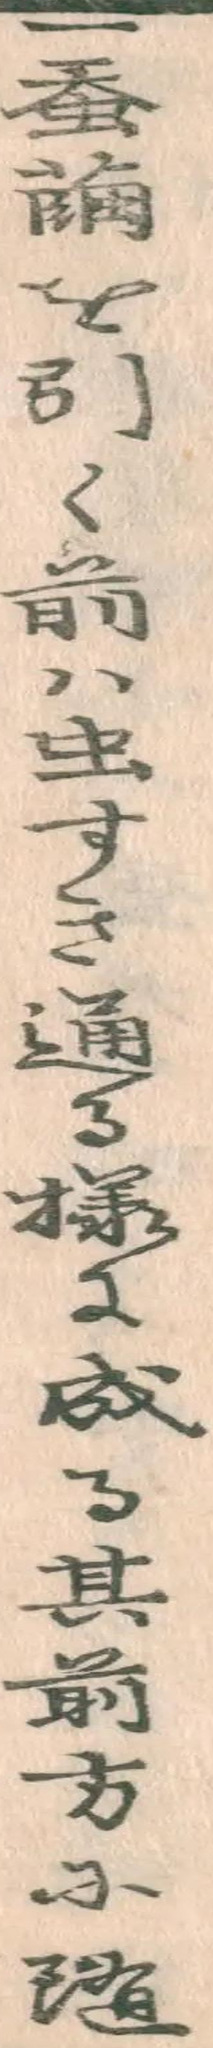一蚕繭を引く前は虫すき通る様に成る其前方に随
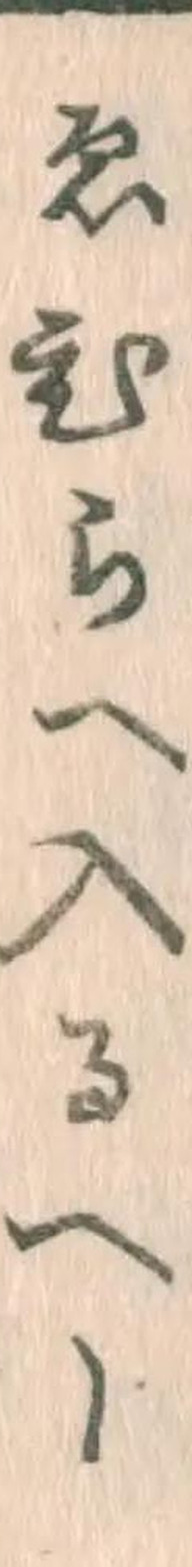ゑひらへ入るへし
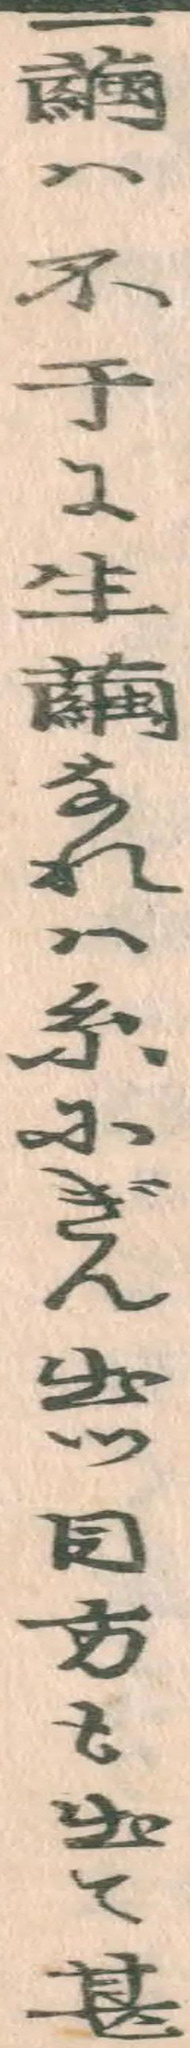一繭は不干に生繭なれは糸にぎん出つ目方も出て甚
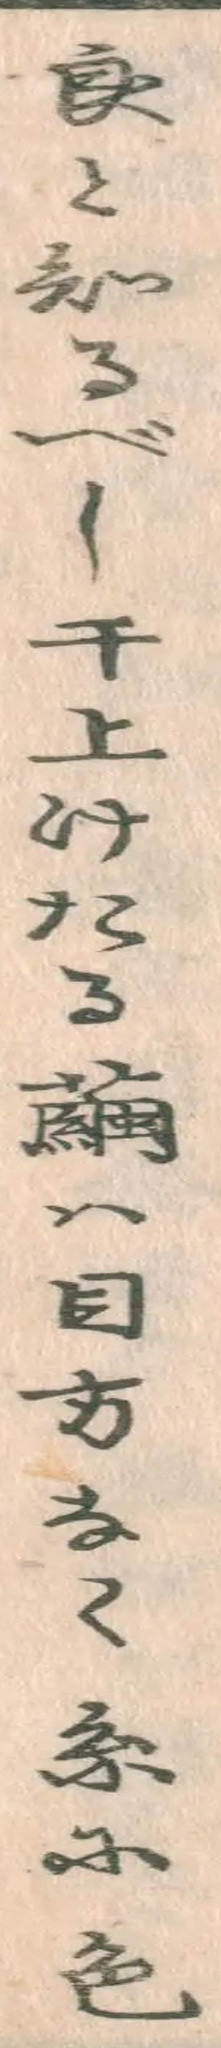良と知るべし干上けたる繭は目方なく糸に色
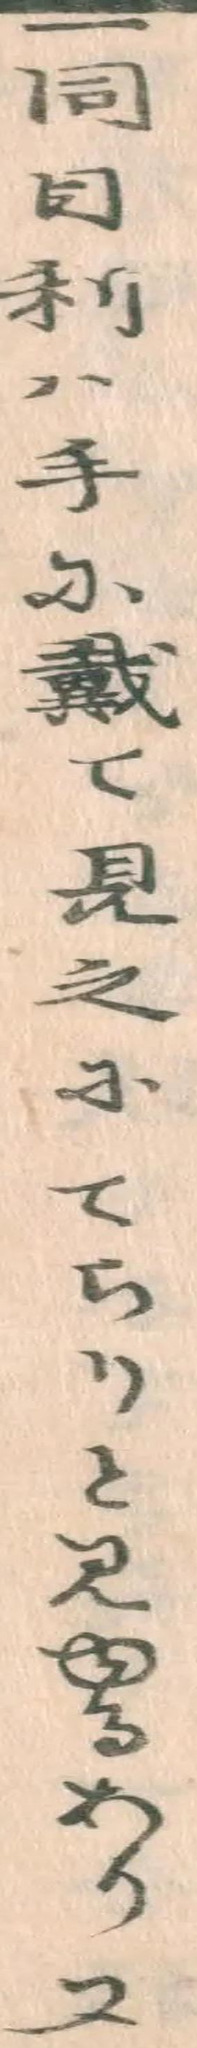一同目利は手に戴て見之にてらりと見ゆるあり又
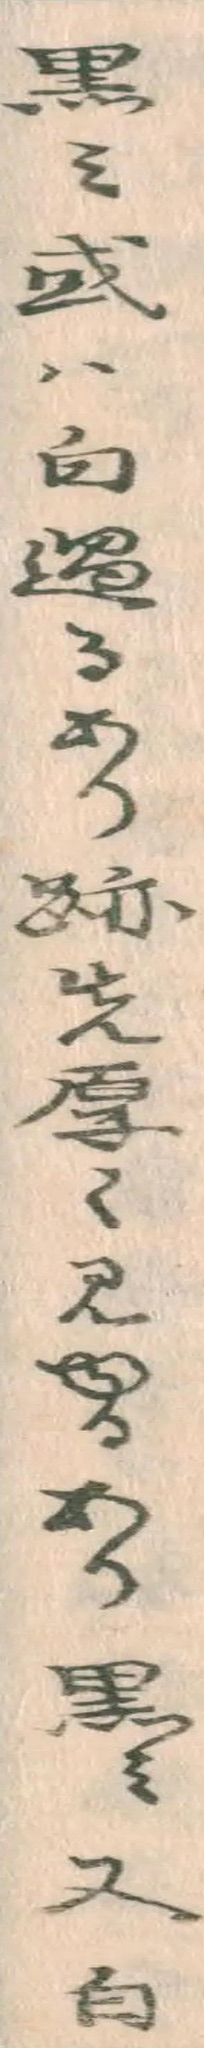黒み或は白過るあり跡先厚く見ゆるあり黒み又白
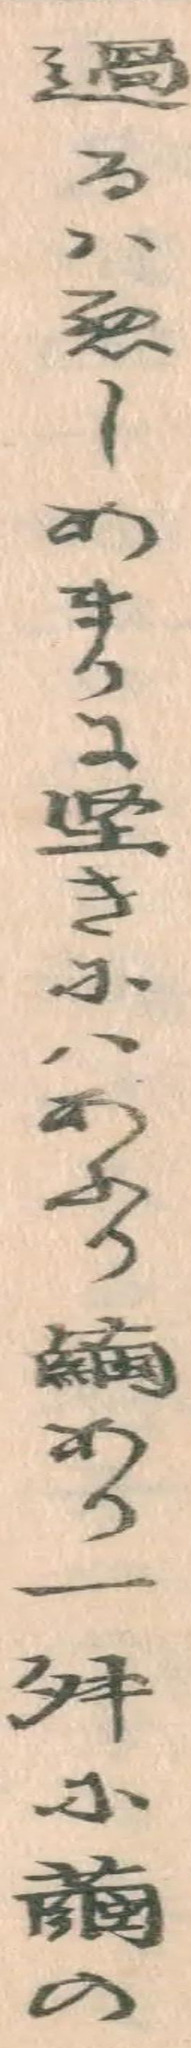過るは悪しあまりに堅きにはあふり繭あり一升に繭の
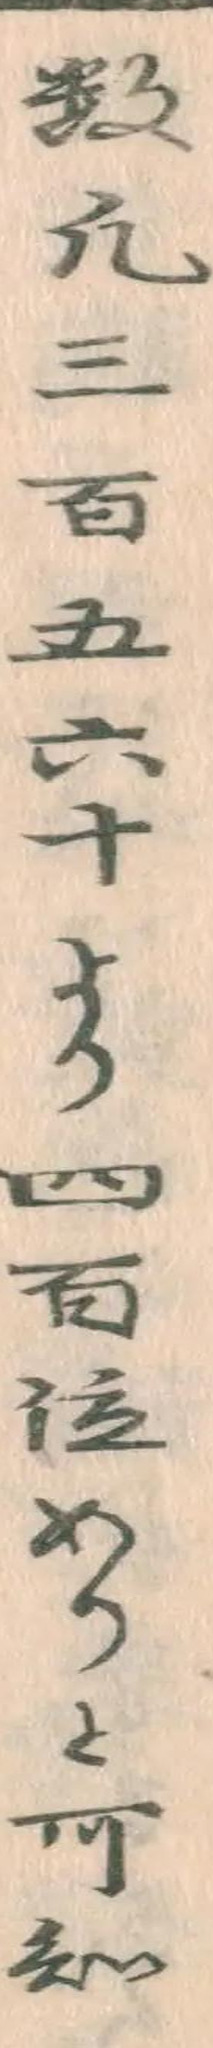数凡三百五六十より四百位ありと可知
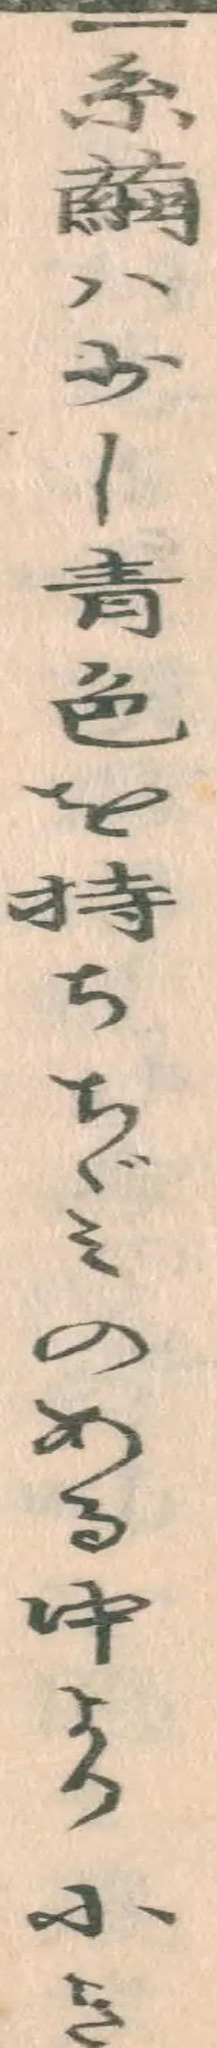一糸繭は少し青色を持ちちゞみのある中より小き
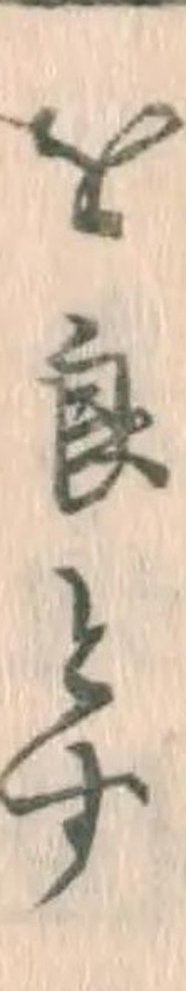を良とす
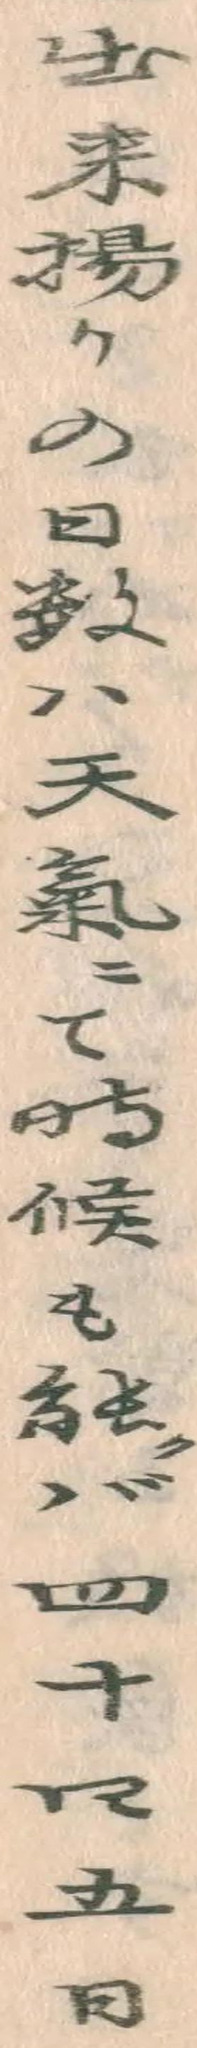一出来揚りの日数は天気にて時候も能くば四十四五日
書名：機織彙編 5巻. [1]
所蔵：国立国会図書館 National Diet Library, JAPAN
